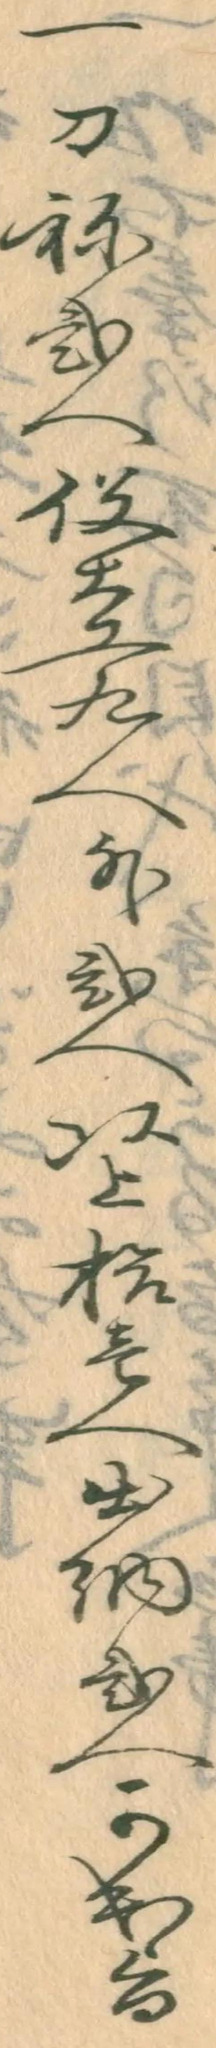一刀祢弐人役大工九人外弐人以上拾壱人出納弐人可遣旨
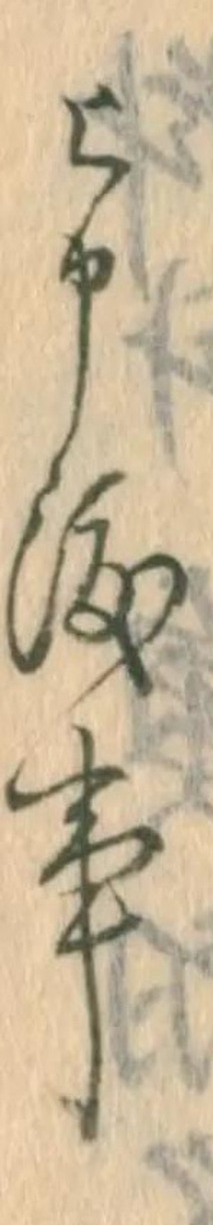被申渡事
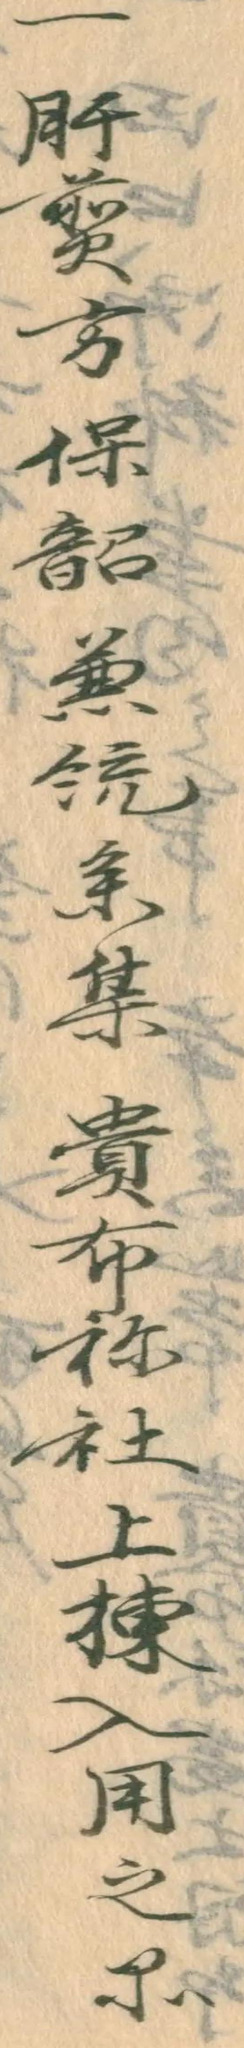一肝煎方保韶兼統参集貴布祢社上棟入用之品
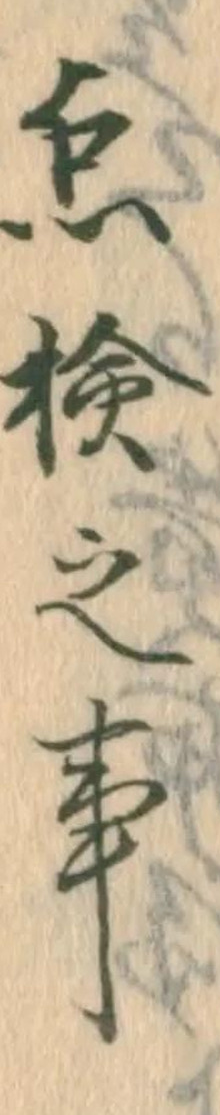点検之事
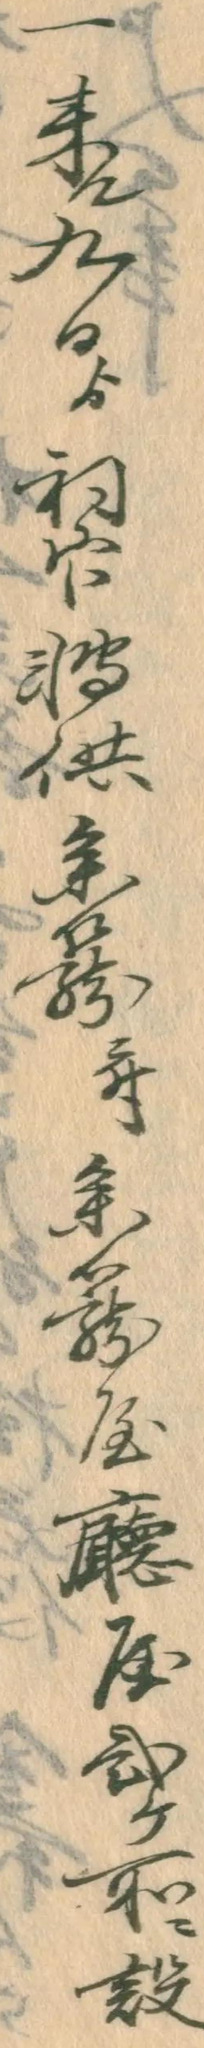一来ル九日ゟ祠官転供参籠ニ付参籠屋庁屋弐ケ所ニ設
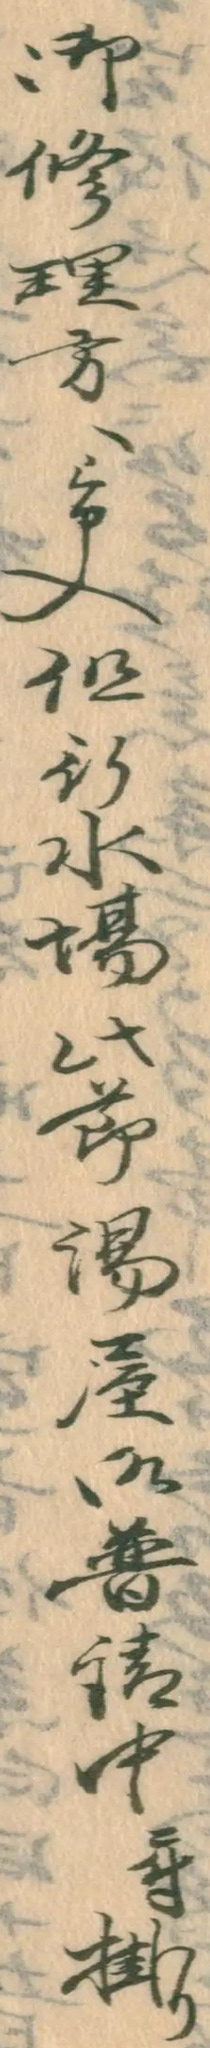御修理方へ被申入但行水場此節湯屋御普請中ニ付掛り
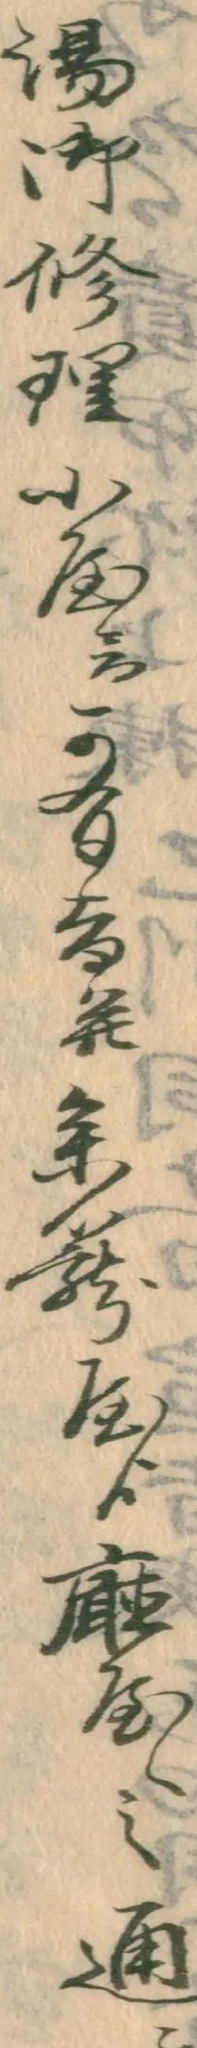湯御修理小屋ニ而可有旨并参籠屋ゟ庁屋へ之通ニ
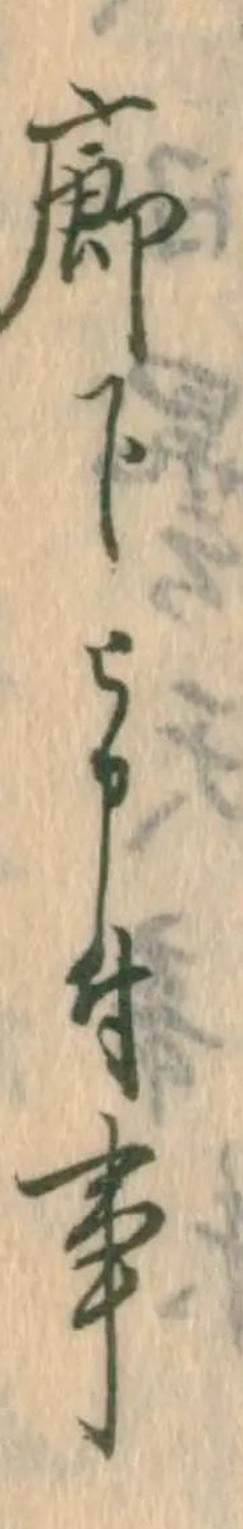廊下被申付事
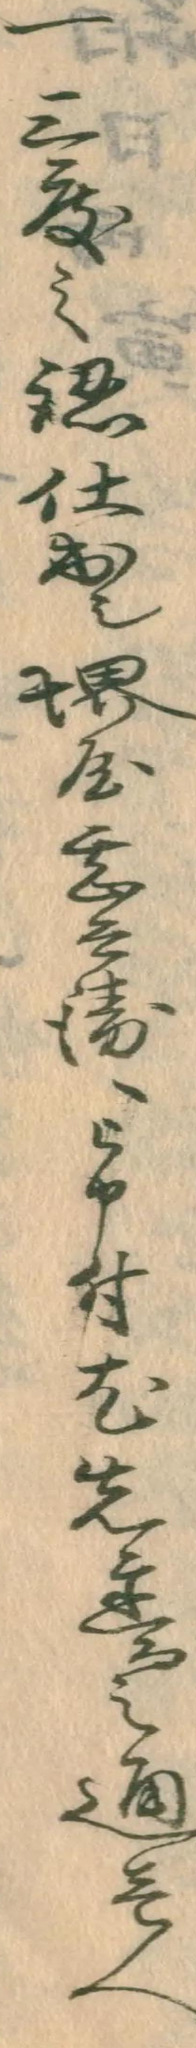一三度之認仕出シ堺屋甚兵衛へ被申付尤先達而之通壱人
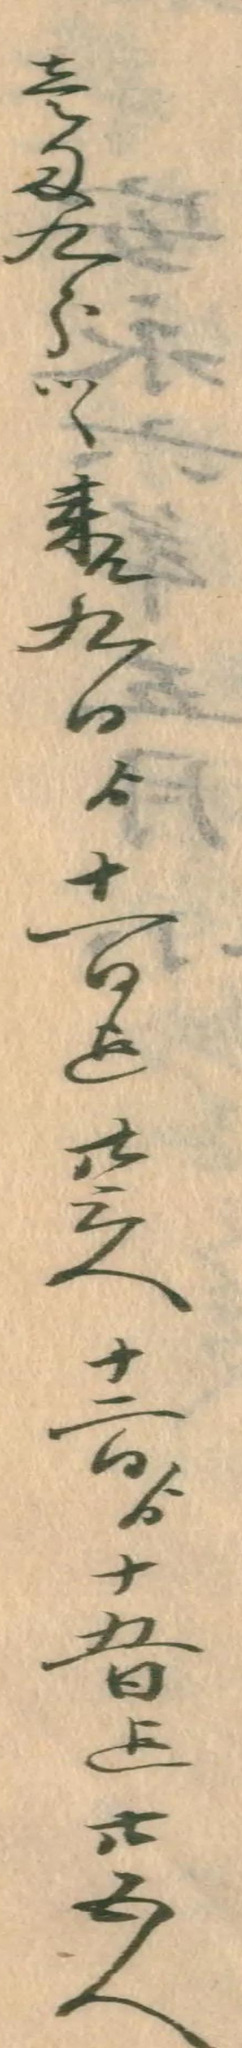壱匁九分ツヽ来ル九日ゟ十一日迄廿三人十二日ゟ十五日迄廿五人
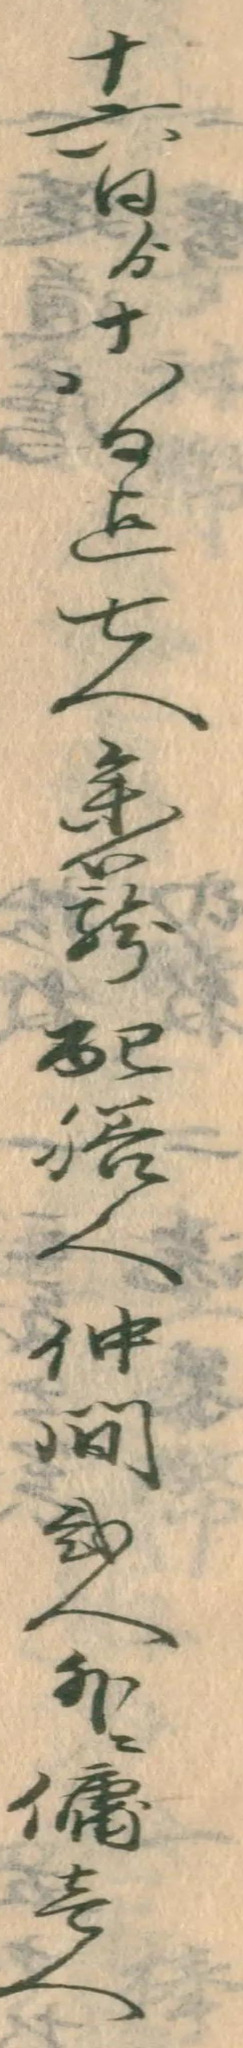十六日ゟ十八日迄七人参籠配繕人仲間弐人外ニ傭壱人
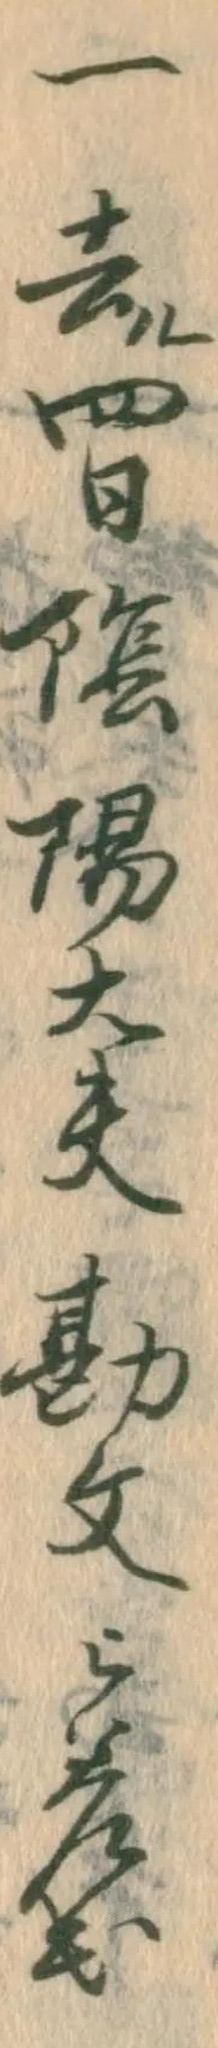一去ル四日陰陽大夫勘文被差出
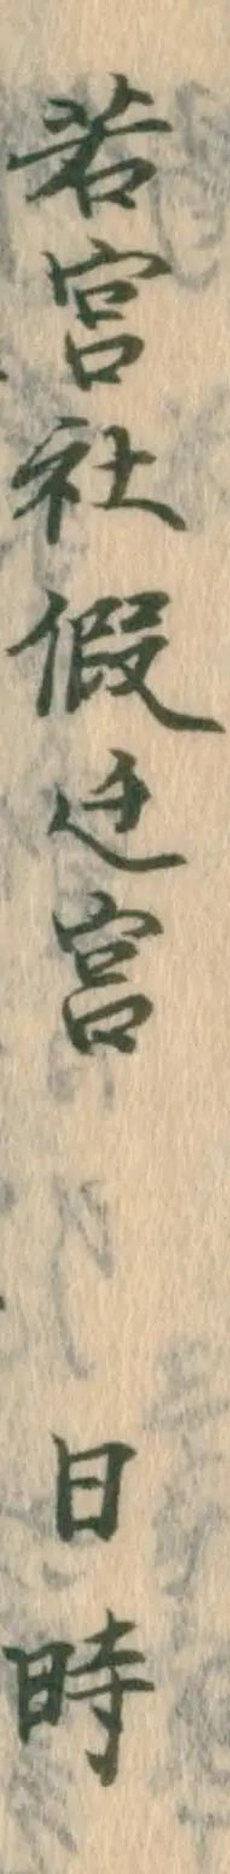若宮社仮迁宮日時
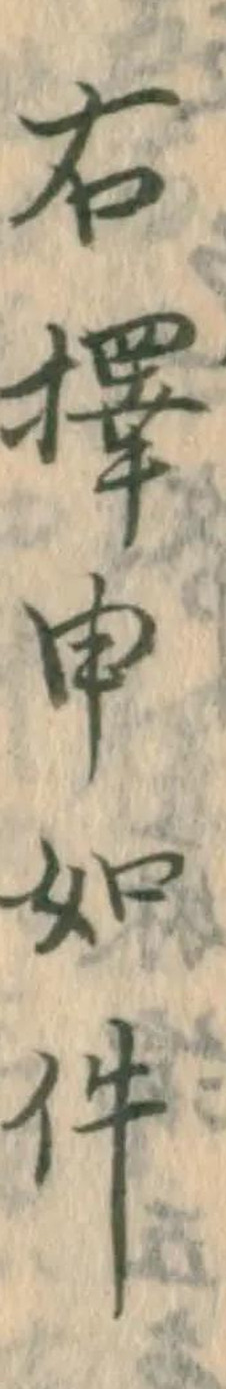右択申如件
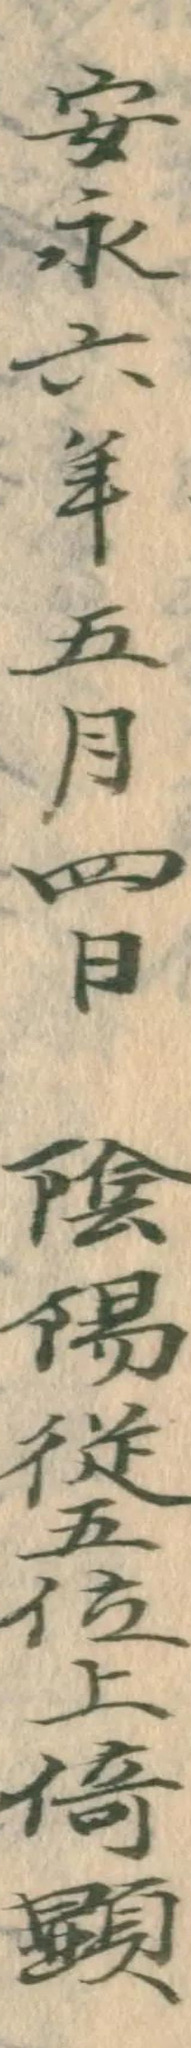安永六年五月四日陰陽従五位上倚顕
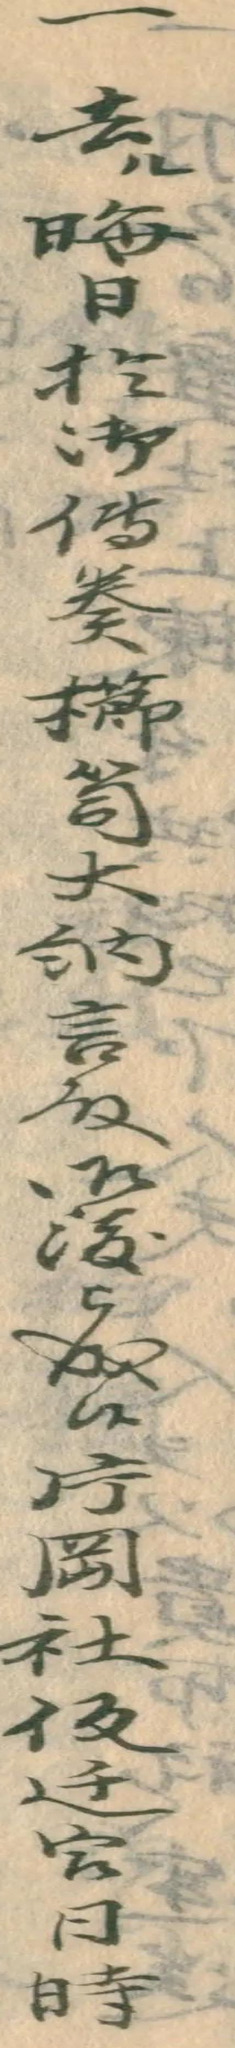一去ル晦日於御伝奏櫛笥大納言殿御渡被成候片岡社仮迁宮日時
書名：賀茂社記録. 第17冊
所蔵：国立国会図書館 National Diet Library, JAPAN
